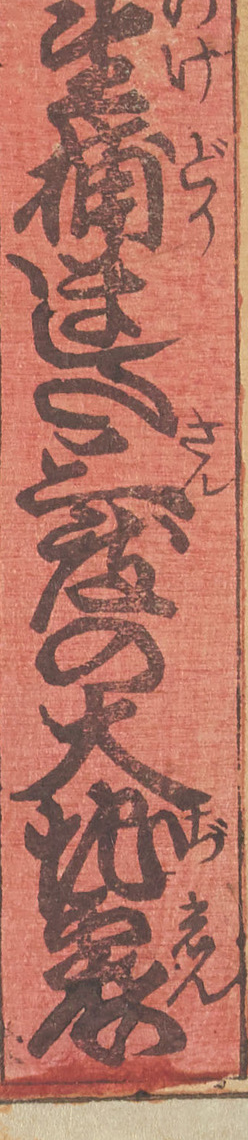生捕ました三度の大地震
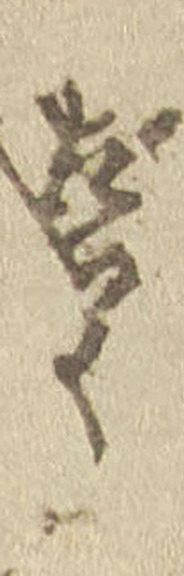だいく
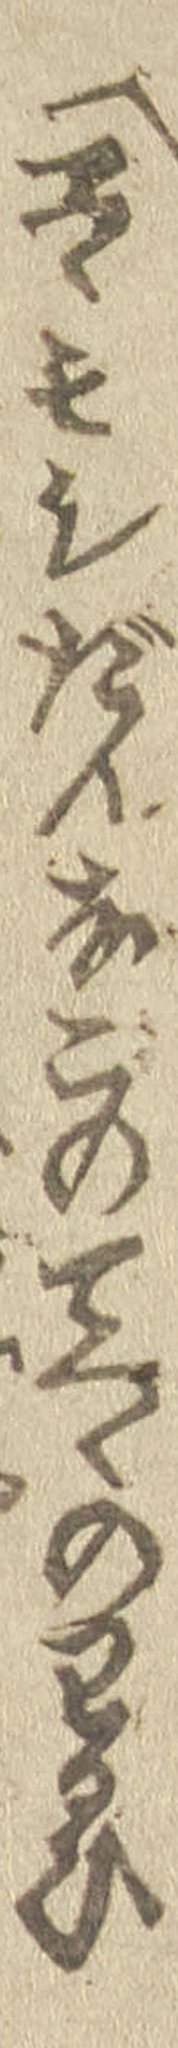〽ヱヽモシだんなこのてへくのわるひ
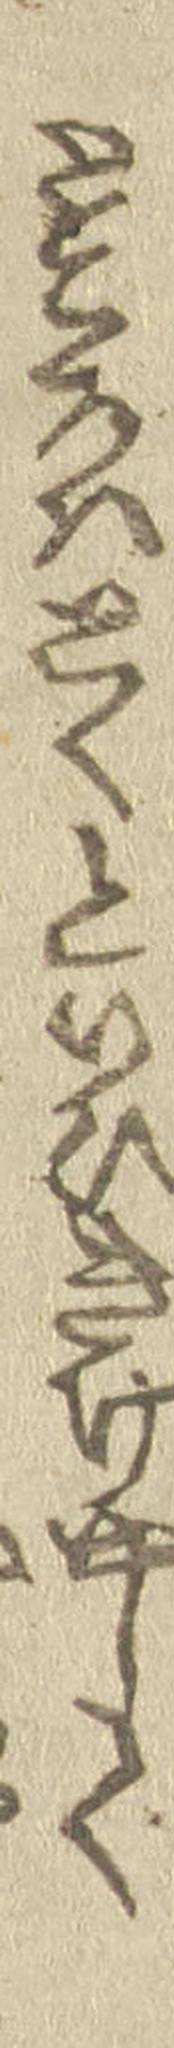ところはとくといひきけやして
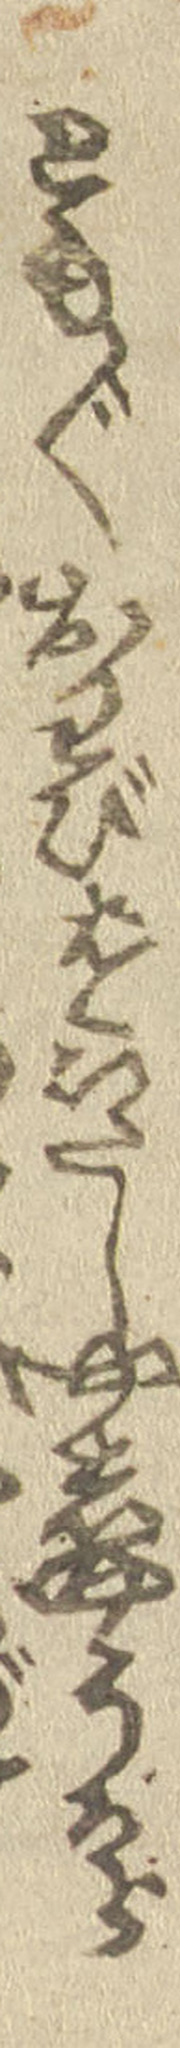とも〴〵おわびをいたしやしゆうから
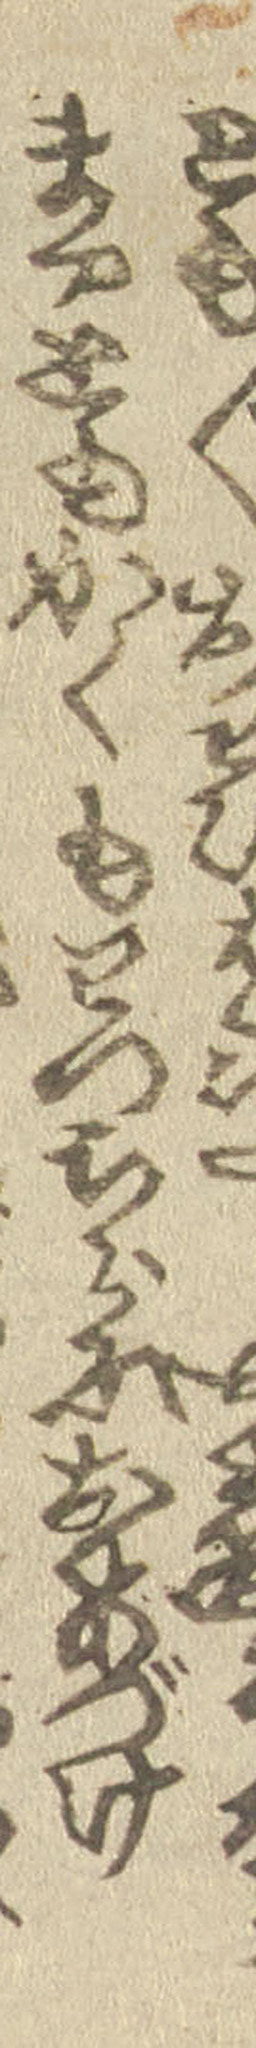まアともかくもわつちらにおあづけ
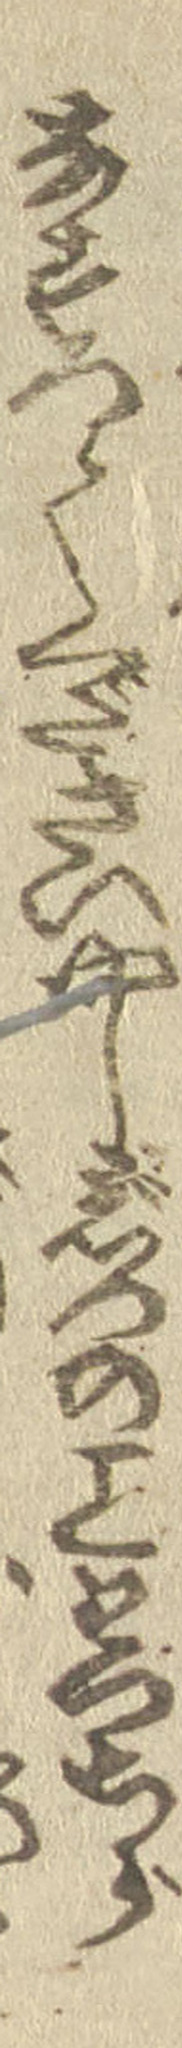なすつてくださいやしじつのことわつちら
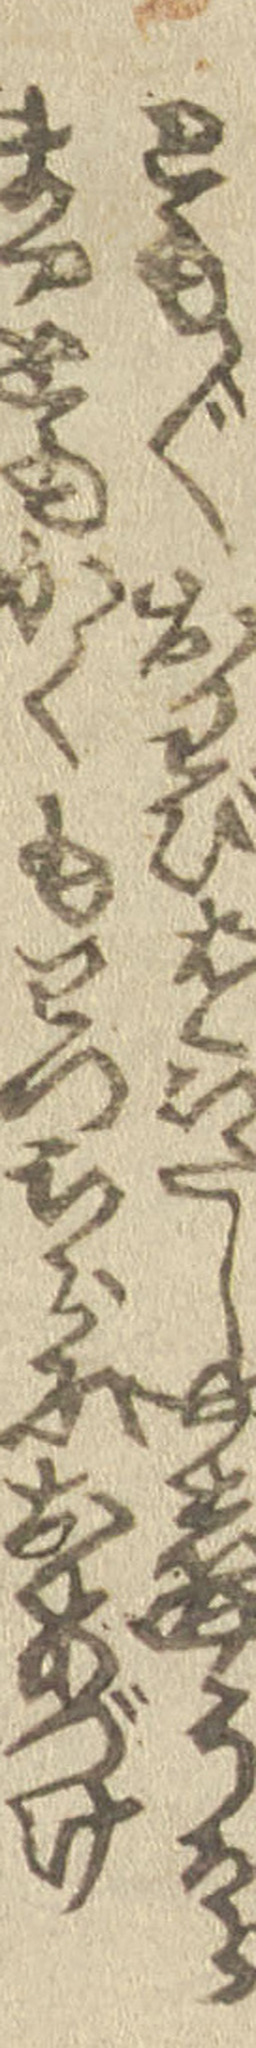まアともかくもわつちらにおあづけ
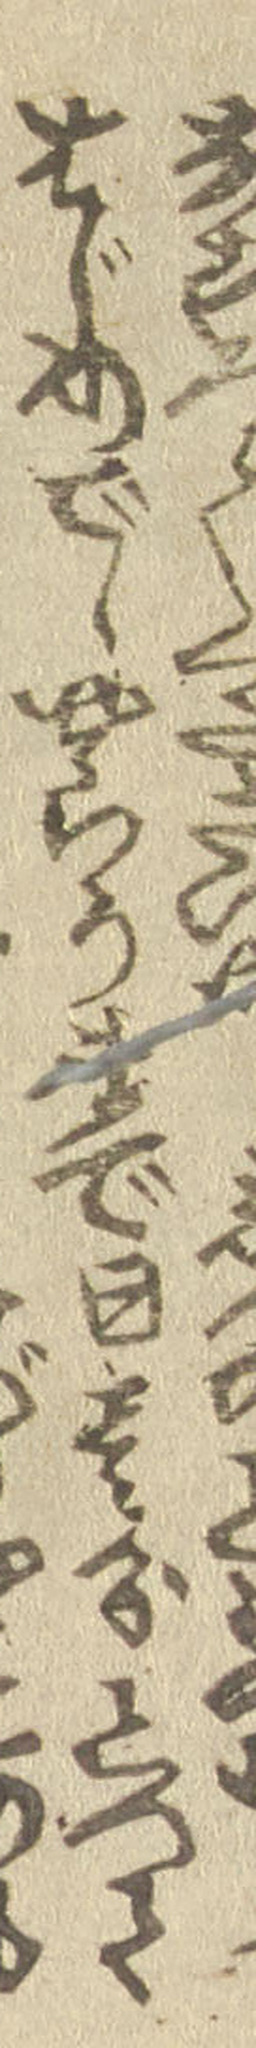はじめでくやらうまで日壱分とつて
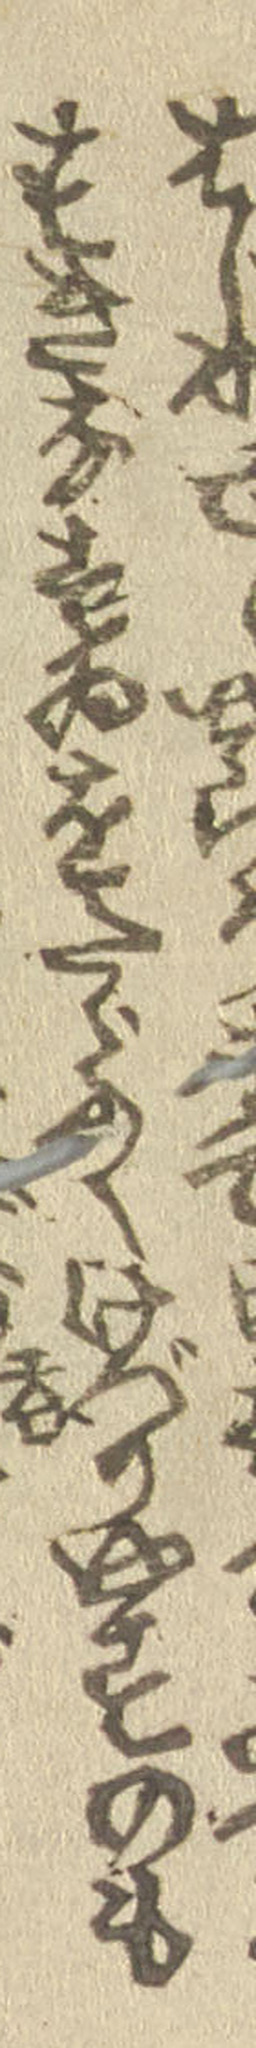すきなすゐをたらふくけづりやすのも
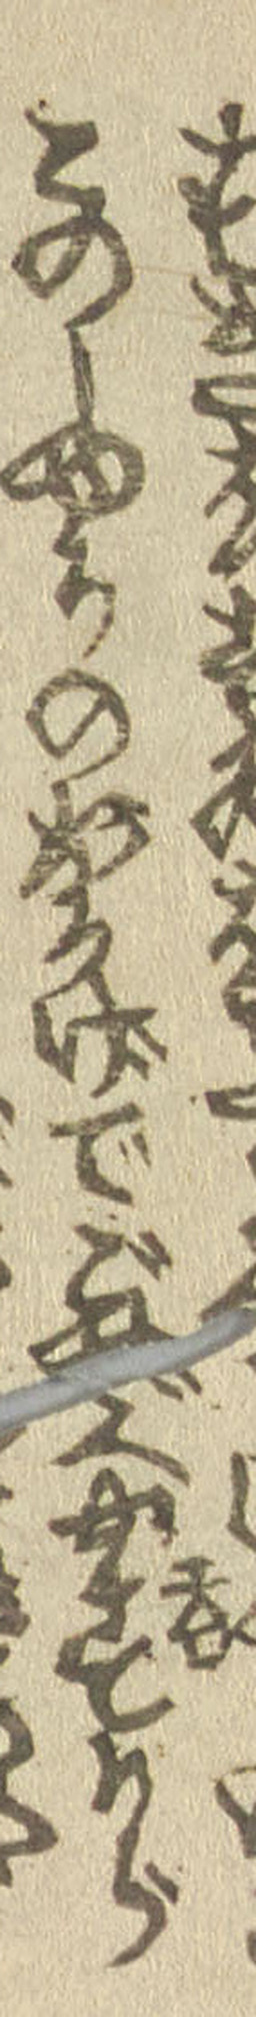このしやつのおかげでごぜへやすから
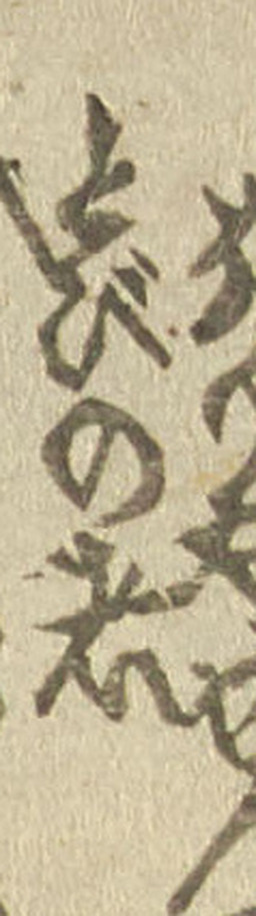とびの者
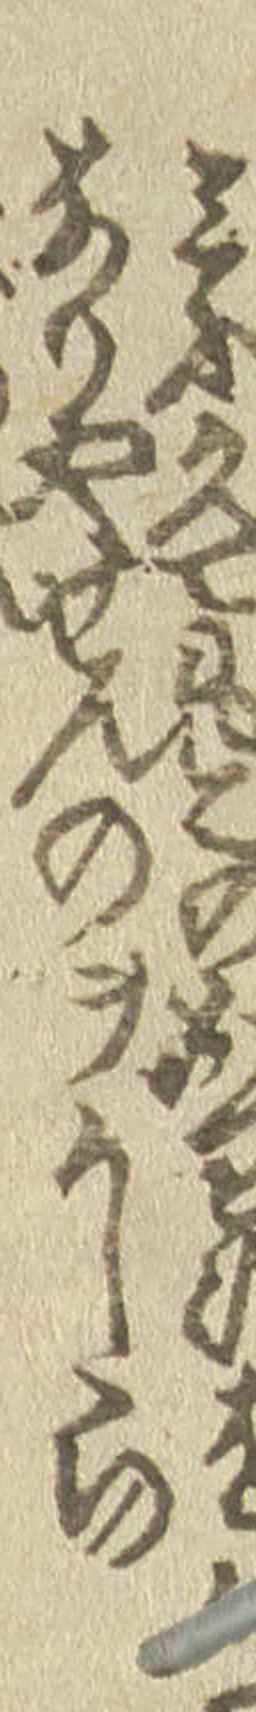ありやせんのヲかしら
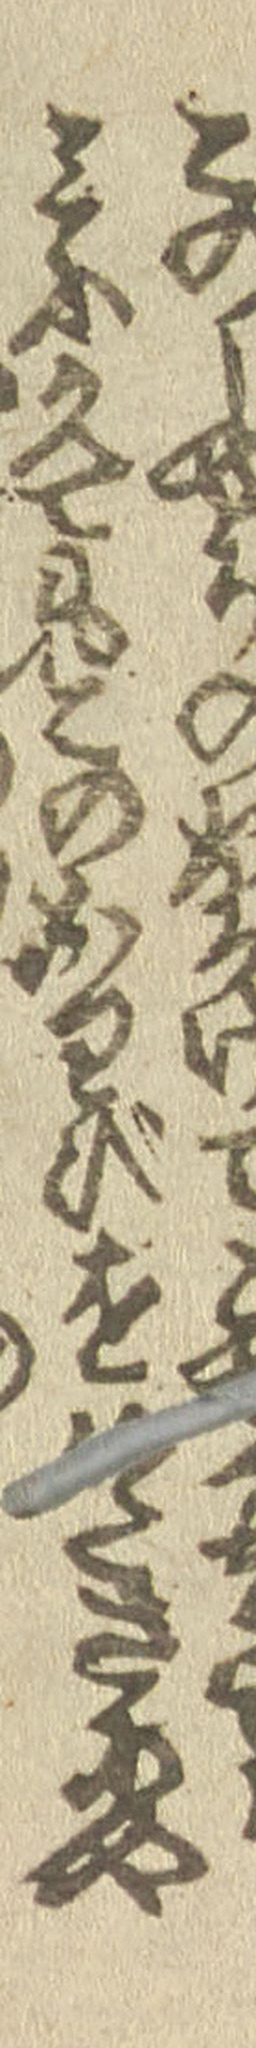みにかへてもこのおわびをくさにや
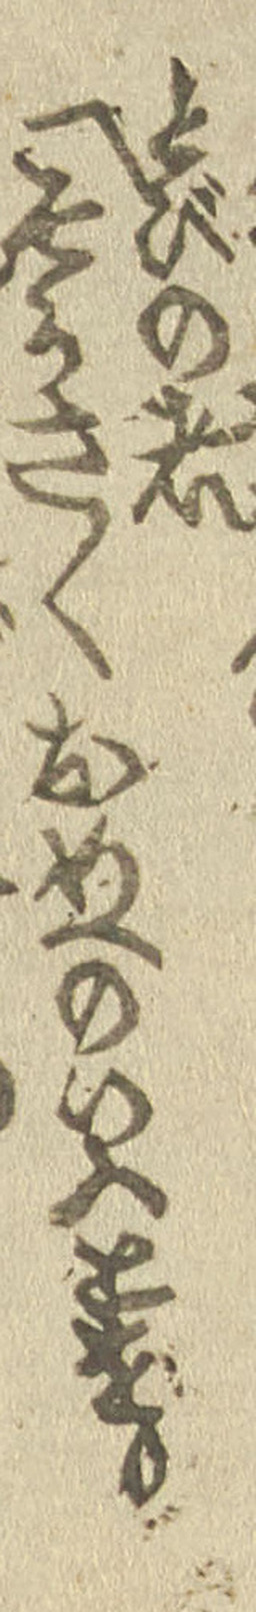〽そうさ〳〵おめへのいふとをり
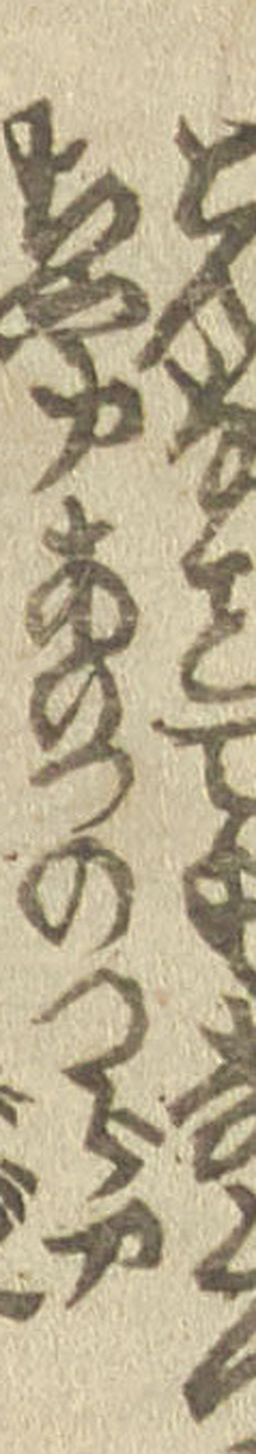ちやアあいつのつらア
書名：生捕ました三度の大地震
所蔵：東京大学総合図書館 General Library in the University of Tokyo, JAPAN
